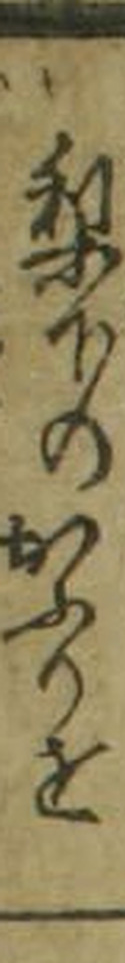梨下のかふりを
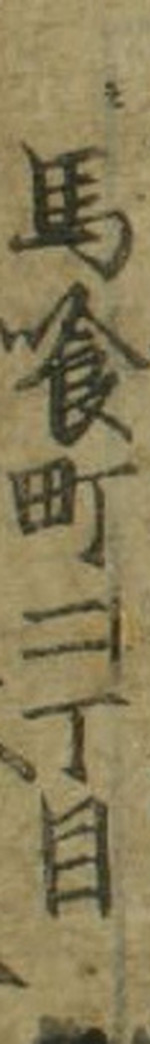馬喰町二丁目
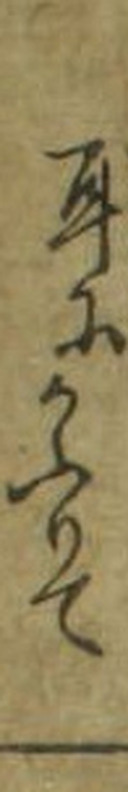耳にかふりて
